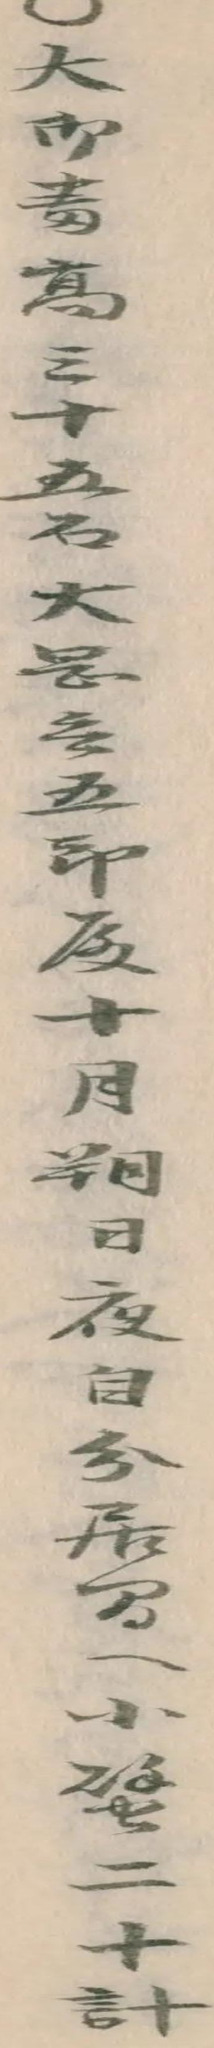〇大御番高三十五石大岡兵五郎殿十月朔日夜自分居間へ小蟹二十計
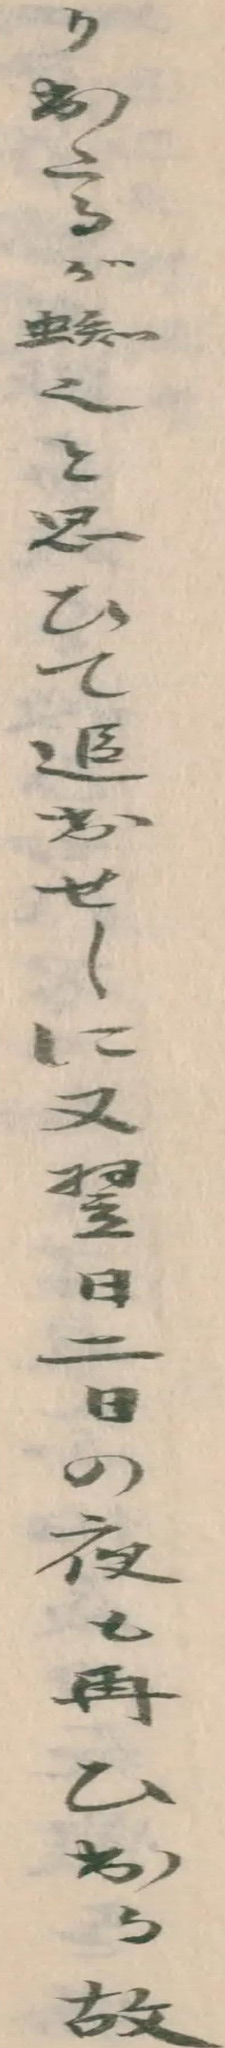り出たるが蜘也と思ひて追出せしに又翌日二日の夜も再ひ出る故
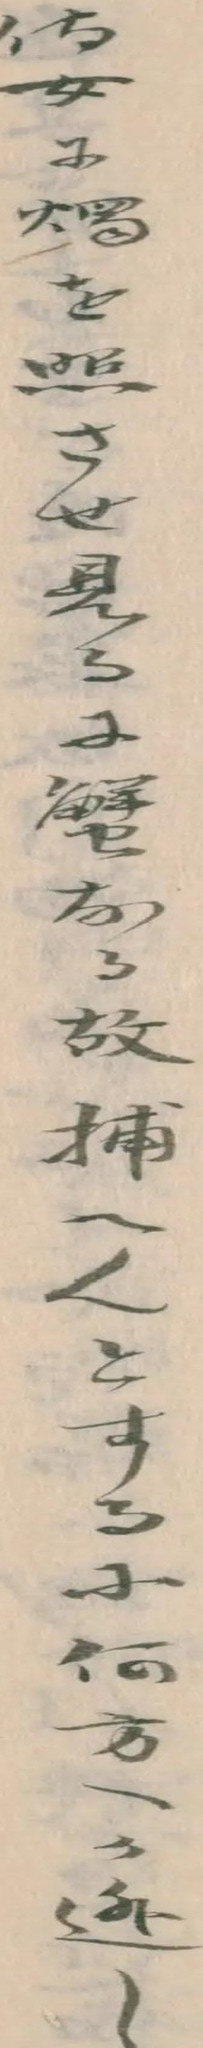侍女に燭を照させ見るに蟹なる故捕へんとするに何方へか逃し
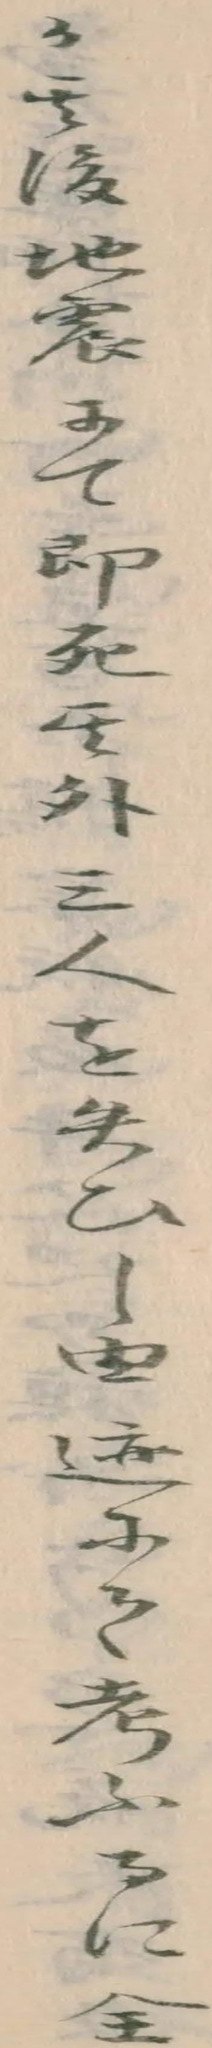か其後地震にて即死其外三人を失ひし由迹にて考ふるに全
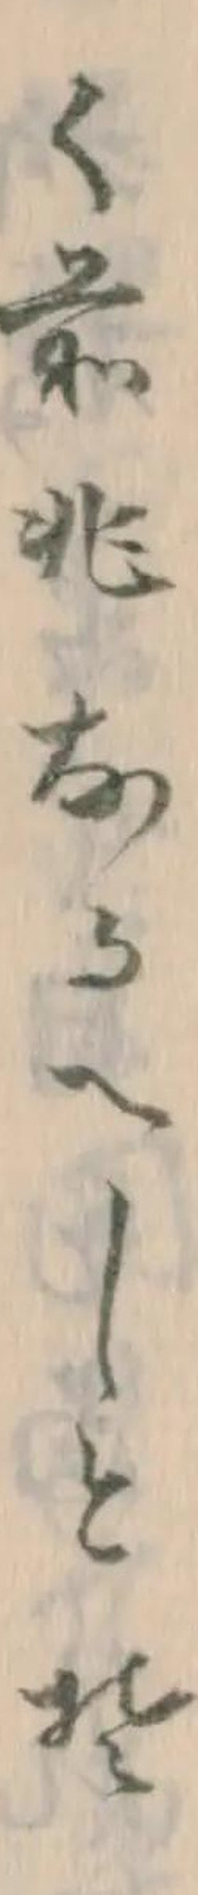く前兆なるへしとそ
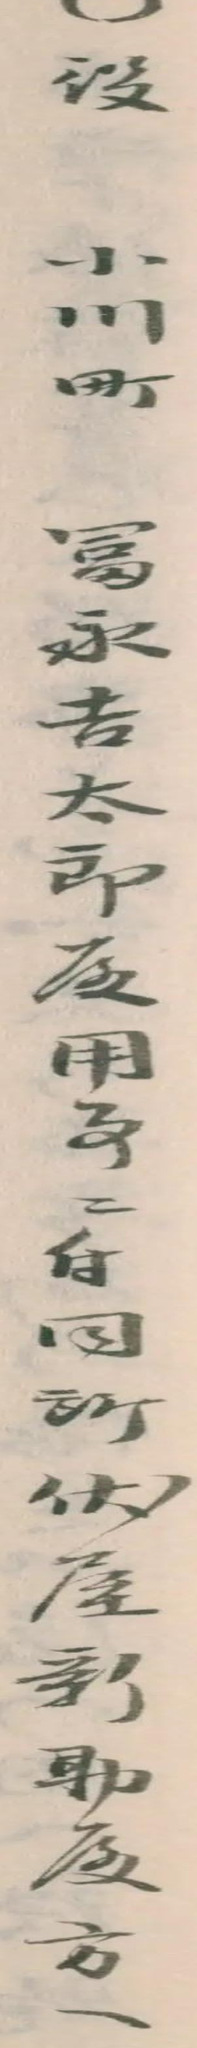〇役小川町冨永吉太郎殿用事付同所伏屋新助殿方へ
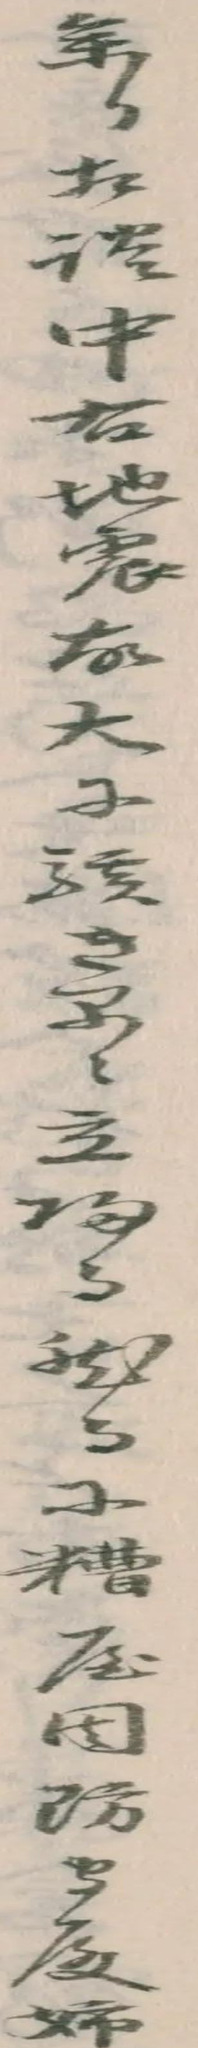参り相談中右地震故大に駭き早々立帰る然るに糟屋周防守殿姉
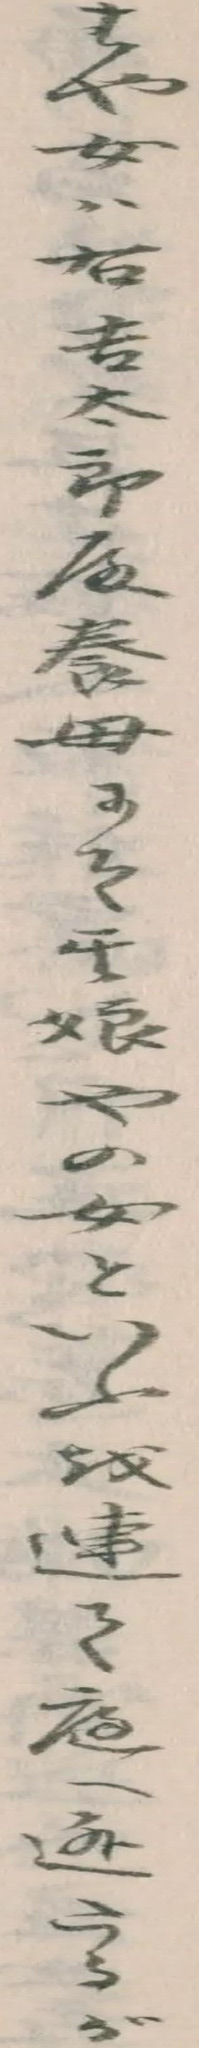はや女は右吉太郎殿養母にて其娘やの女といふを連て庭へ逃たるが
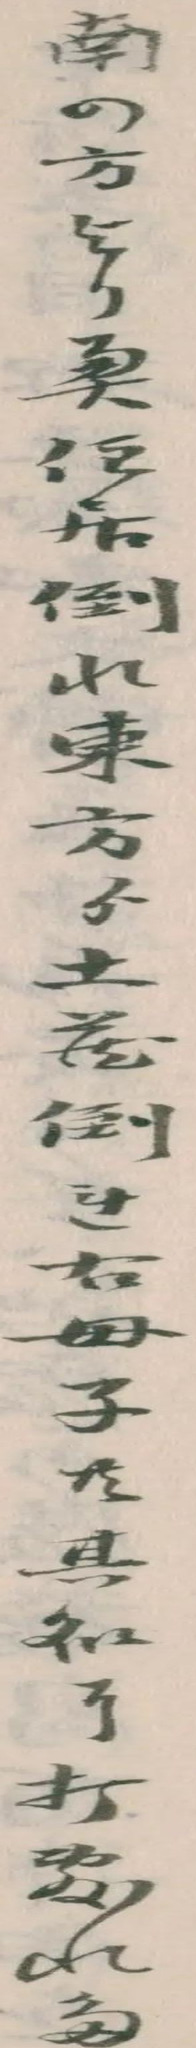南の方より奥住居倒れ東方ゟ土蔵倒れ右母子共其処に打敷れた
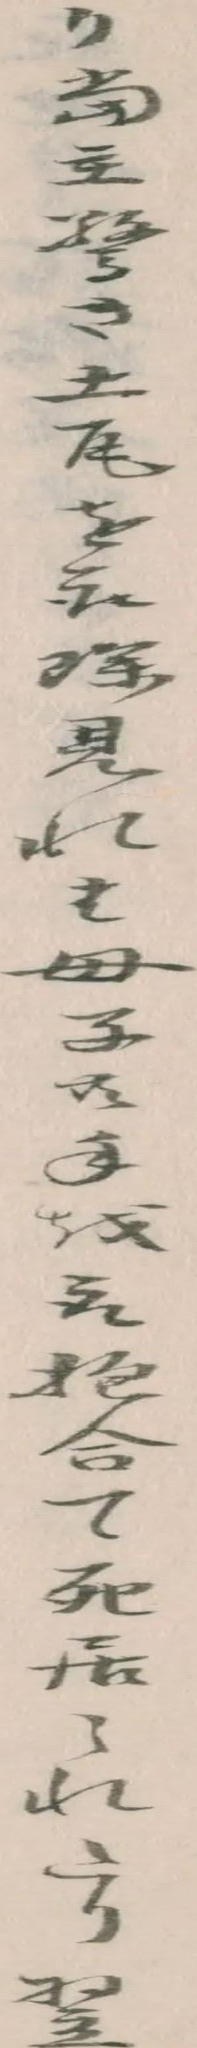り当主驚き土瓦を取除見れは母子共手を取抱合て死居られたり翌
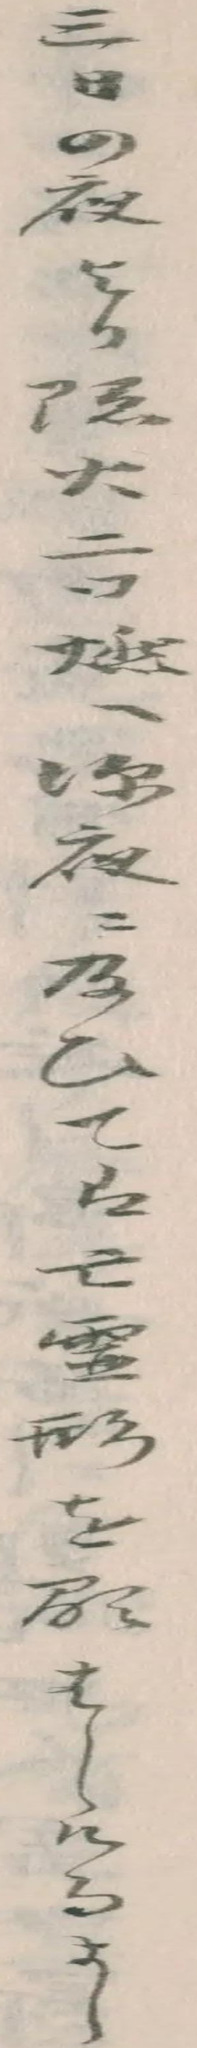三日の夜より隠火二ツ燃へ深夜に及ひては亡霊形を顕はしけるよし
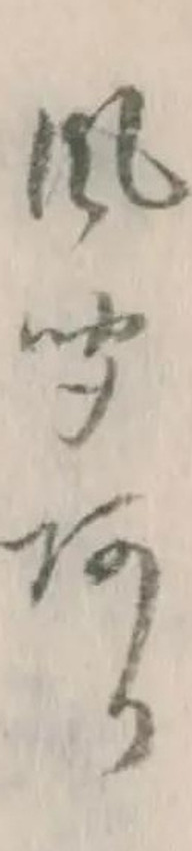風聞あり
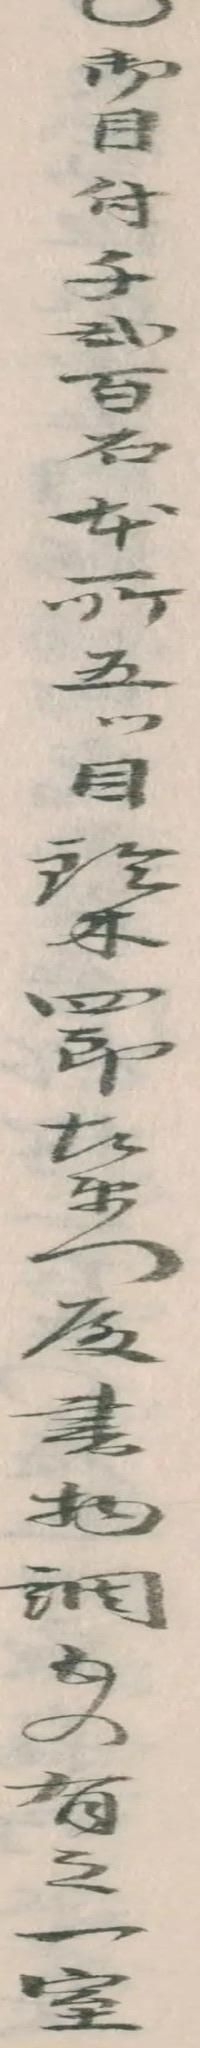〇御目付千弐百石本所五ツ目鈴木四郎左衛門殿書物調もの有之一室
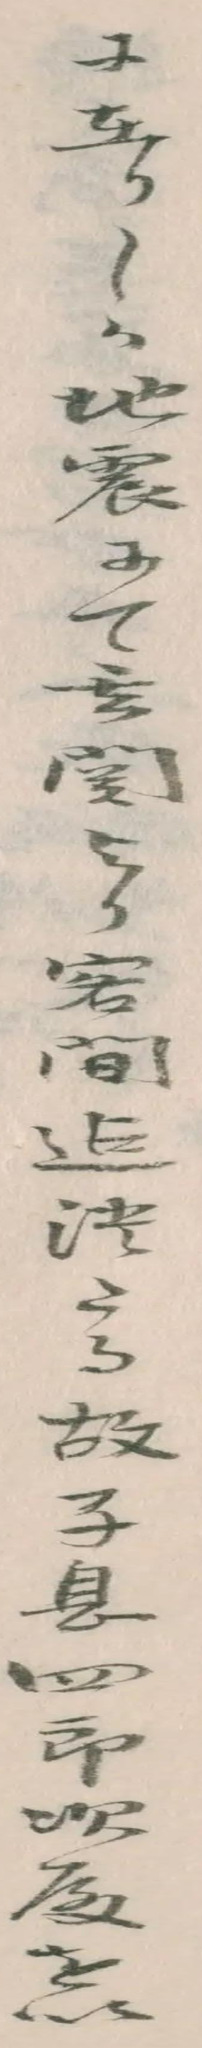に在りしか地震にて玄関より客間迄潰たる故子息四郎次殿を以
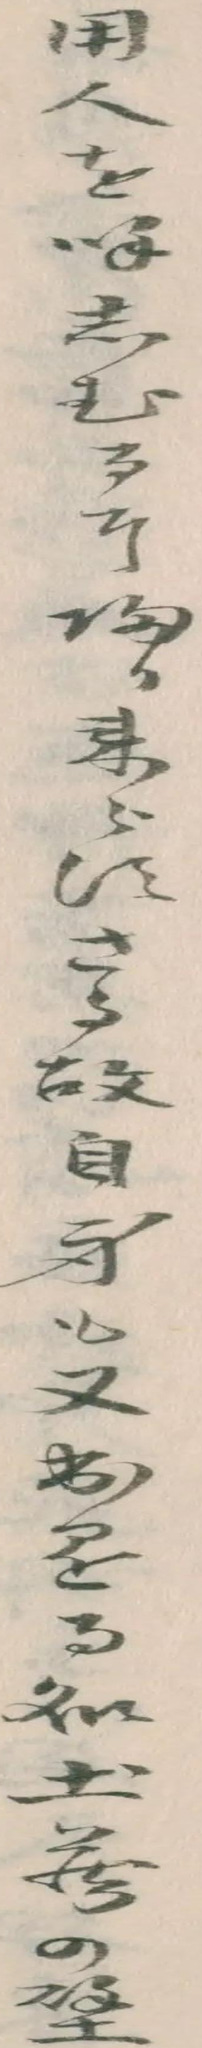用人を呼しむるに帰り来らすさる故自身も又出懸る処土蔵の壁

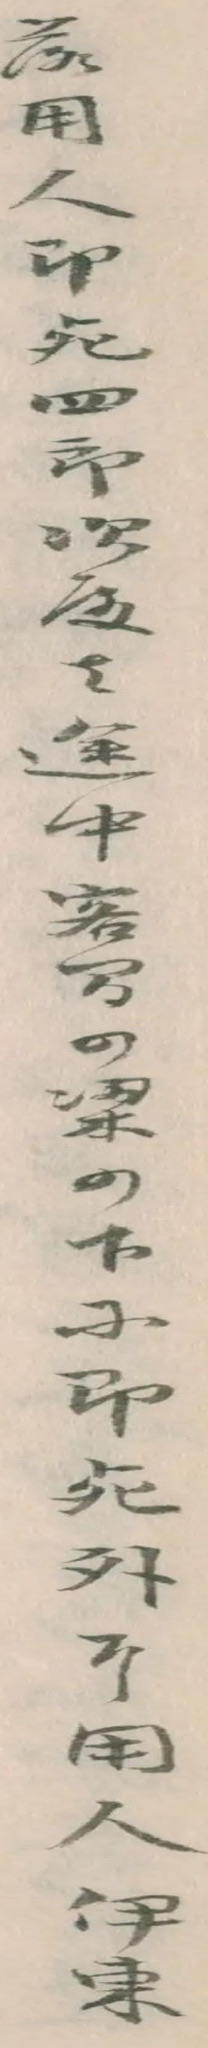落用人即死四郎次殿は途中客間の梁の下に即死外に用人伊東
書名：地災撮要. 巻10(地震之部) 上,下
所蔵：国立国会図書館 National Diet Library, JAPAN
